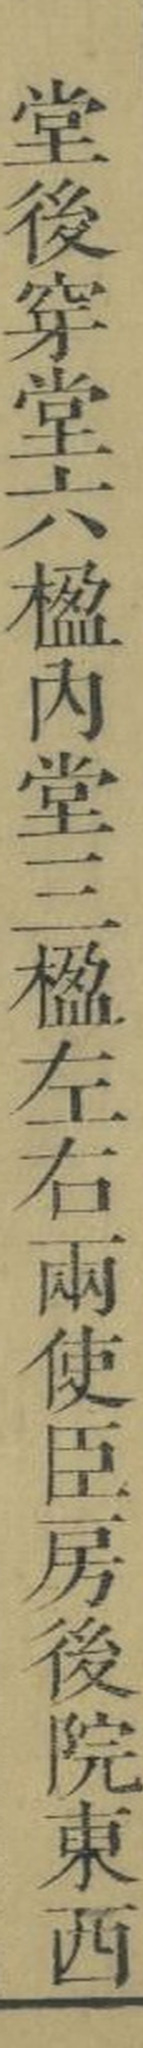堂後穿堂六楹内堂三楹左右兩使臣房後院東西
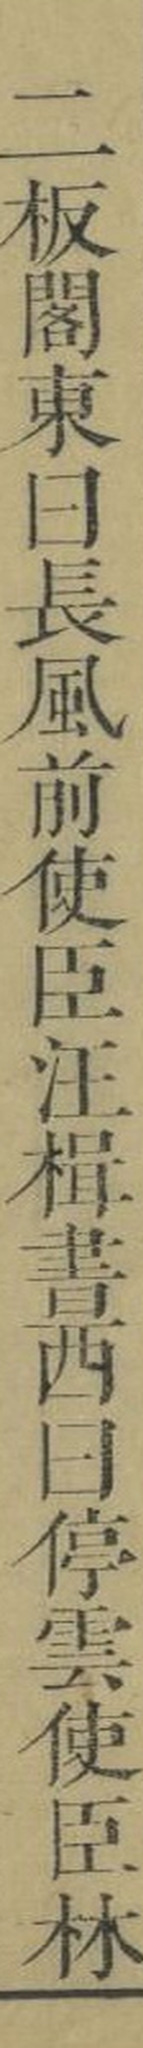二板閣東曰長風前使臣汪楫書西曰停雲使臣林
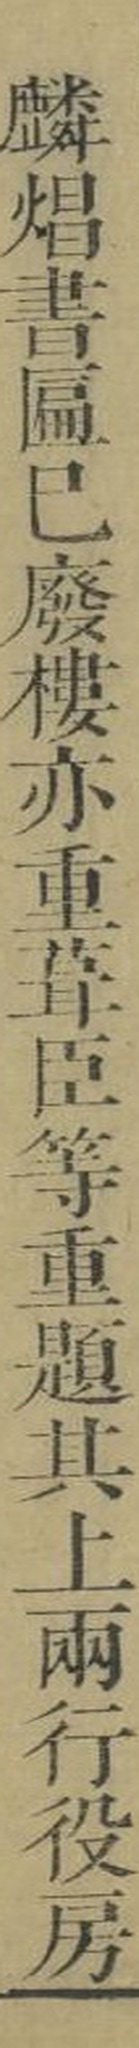麟焻書匾巳廢樓亦重葺臣等重題其上兩行役房
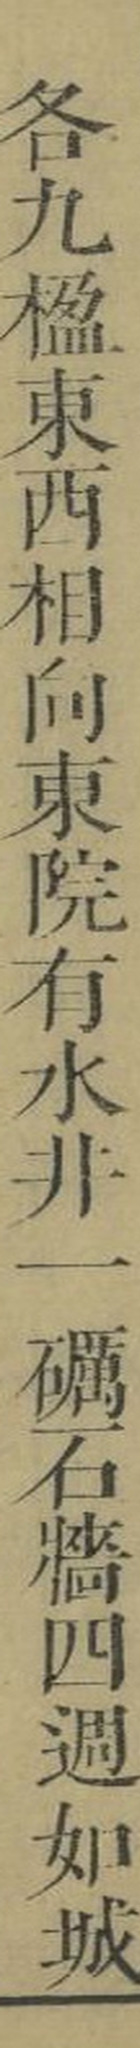各九楹東西相向東院有水井一礪石牆四週如城
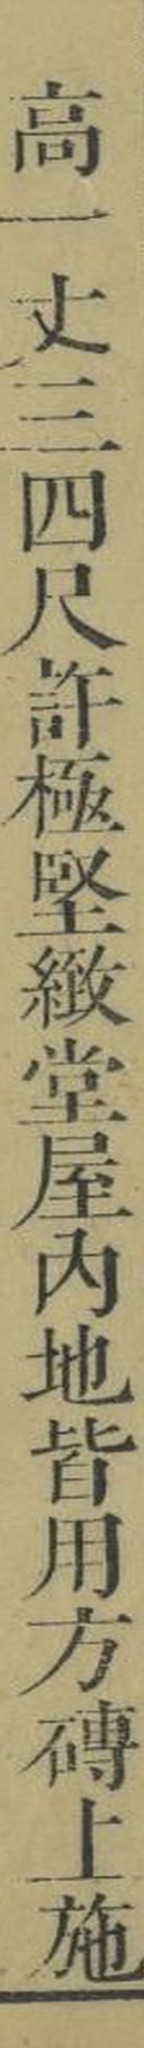高一丈三四尺許極堅緻堂屋内地皆用方磚上施
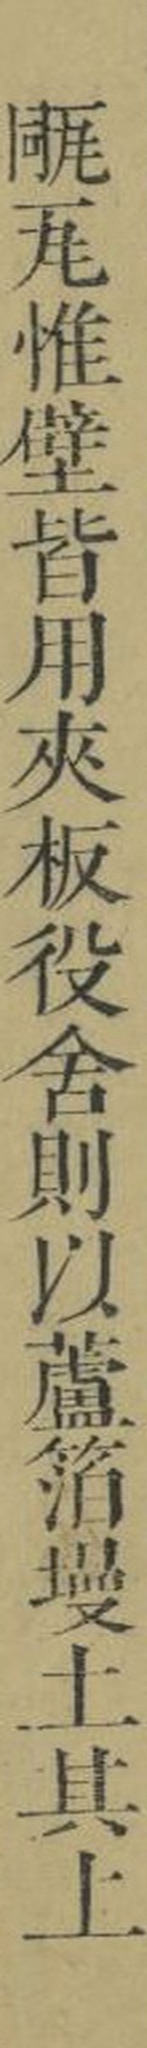瓦惟壁皆用夾板役舎則以蘆箔墁土其上
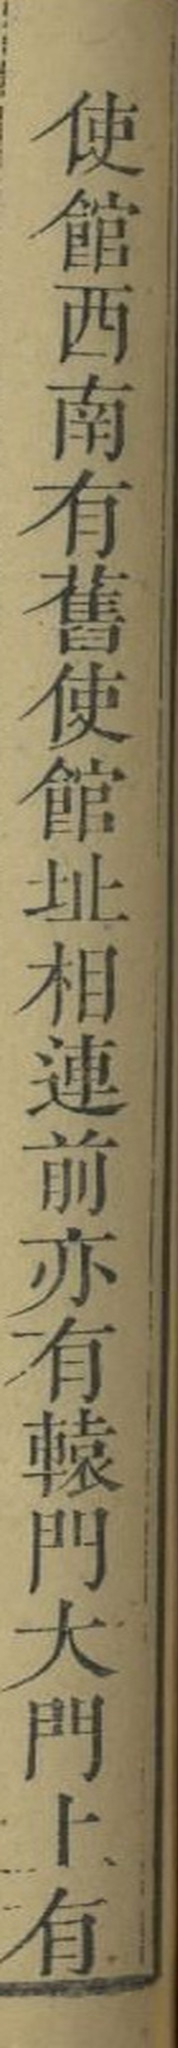使館西南有舊使館址相連前亦有轅門大門上有
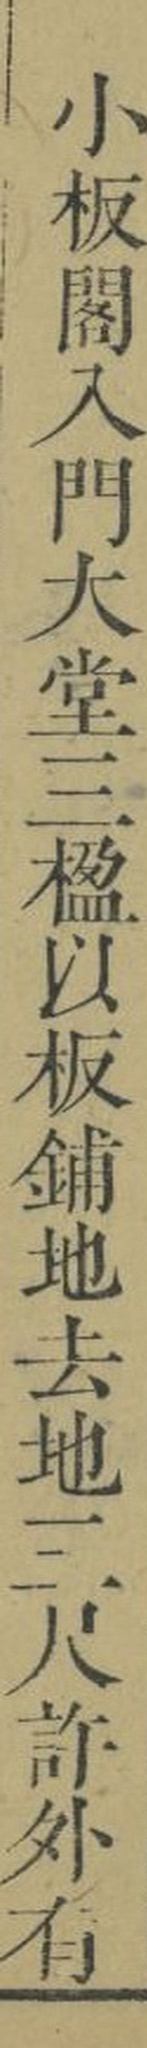小板閣入門大堂三楹以板鋪地去地三尺許外有
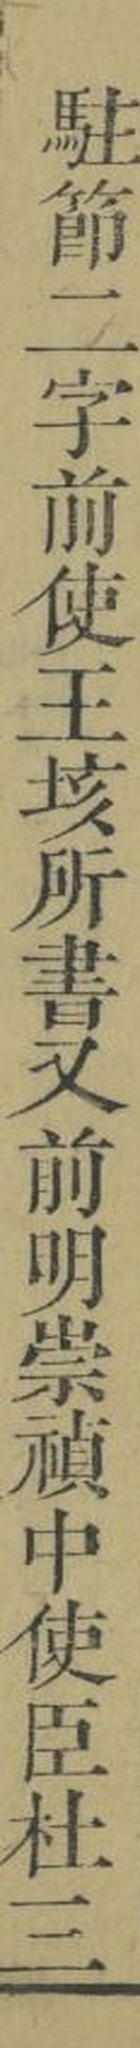駐節二字前使王垓所書又前明崇禎中使臣杜三
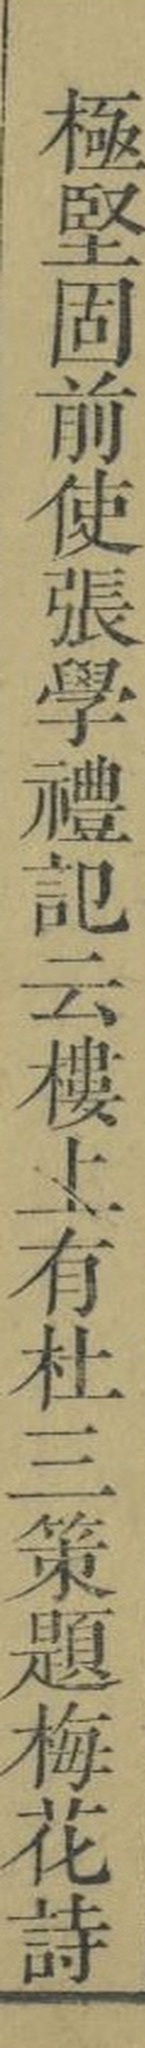極堅固前使張學禮記云樓上有杜三策題梅花詩
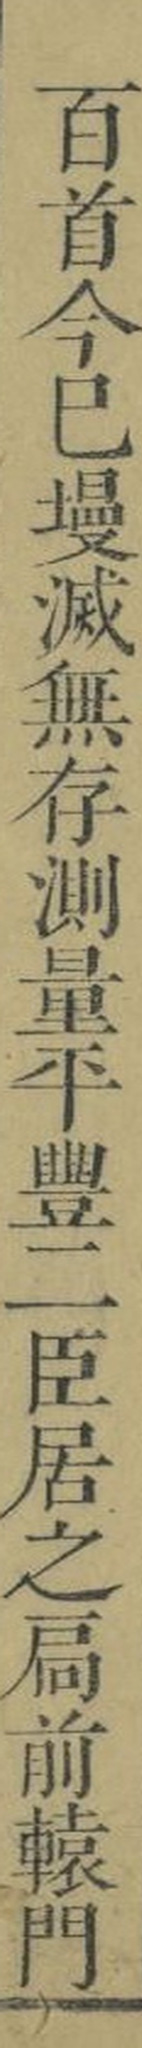百首今巳墁滅無存測量平豐二臣居之扃前轅門
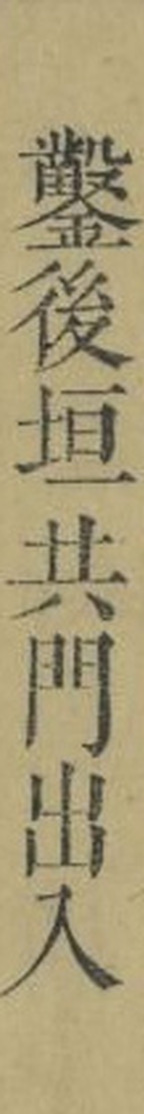鑿後垣共門出入
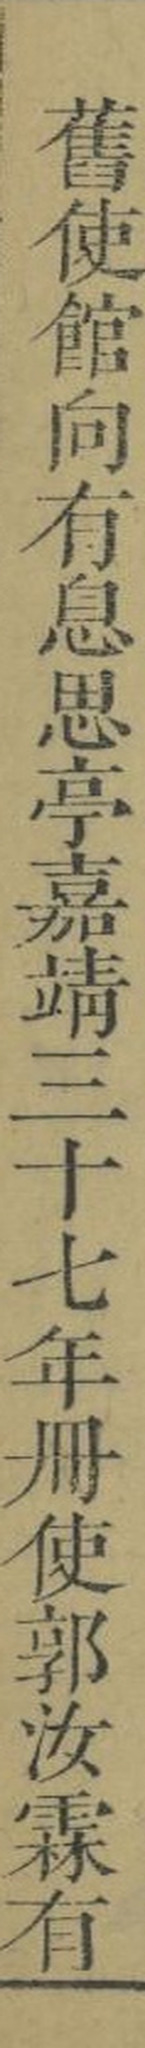舊使館向有息思亭嘉靖三十七年冊使郭汝霖有

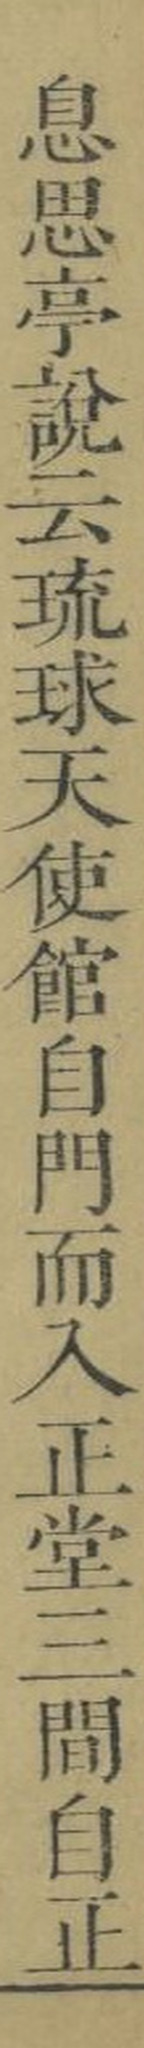息思亭說云琉球天使館自門而入正堂三間自正
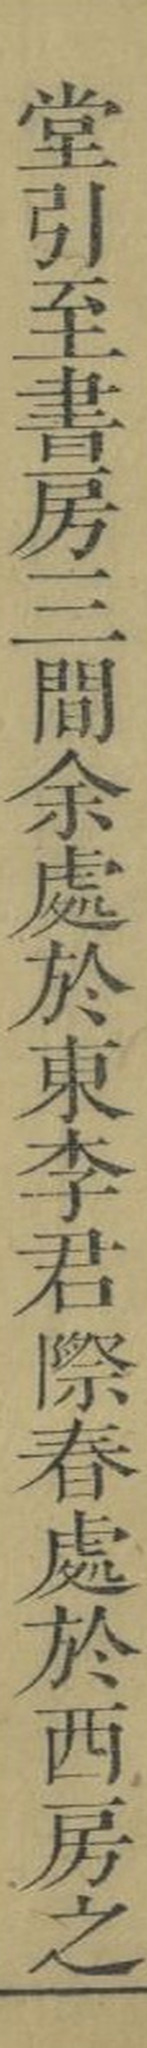堂引至書房三間余處於東李君際春處於西房之
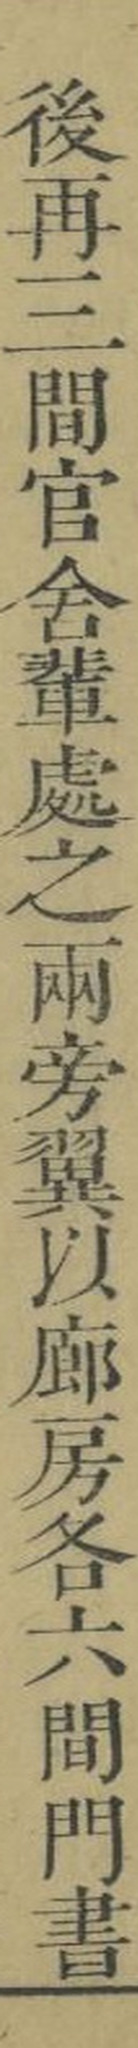後再三間官舎輩處之兩旁翼以廊房各六間門書
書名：中山伝信録 巻二
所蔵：University of the Ryukyus Library
